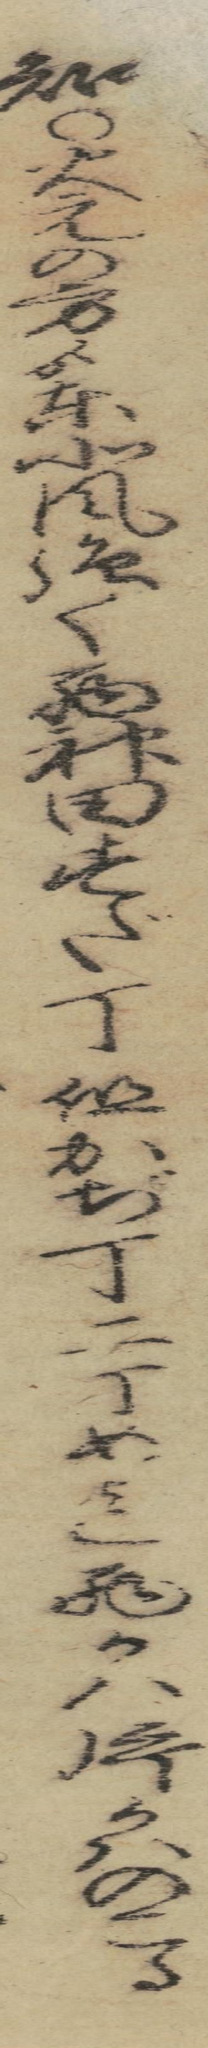知◯火元の方ゟ東北風強く西神田すだ丁西かぢ丁二丁め迄西かは片かはのこる
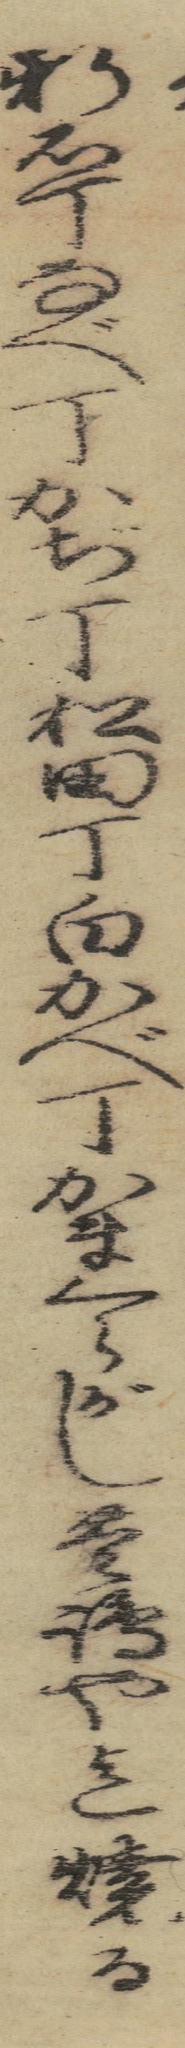新石丁なべ丁かぢ丁松田丁白カベ丁かまくらかし曾嶋や迄焼る
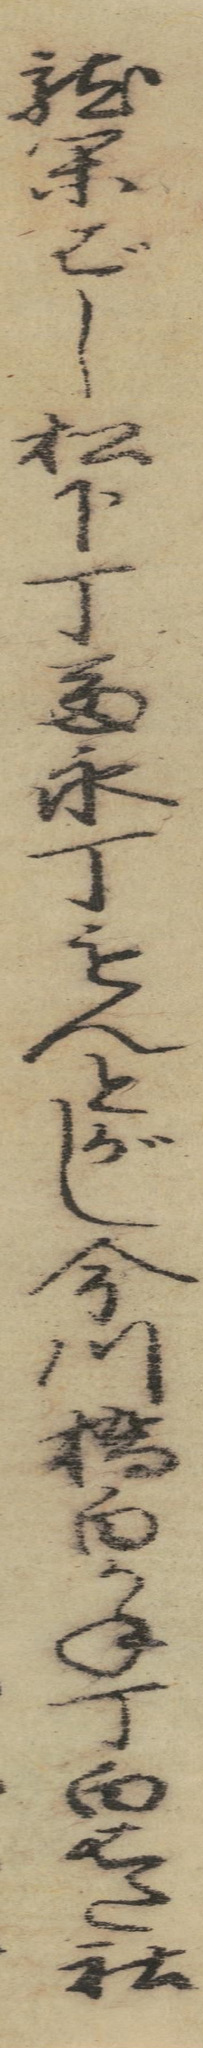龍閑ばし松下丁冨永丁もんとがし今川橋白かね丁白はた社
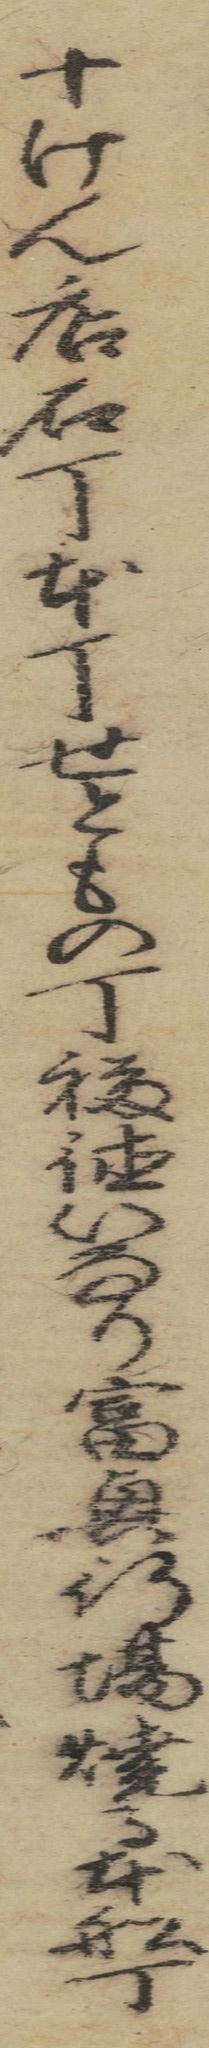十けん店石丁本丁せともの丁福徳いなり富興行場焼る本松丁
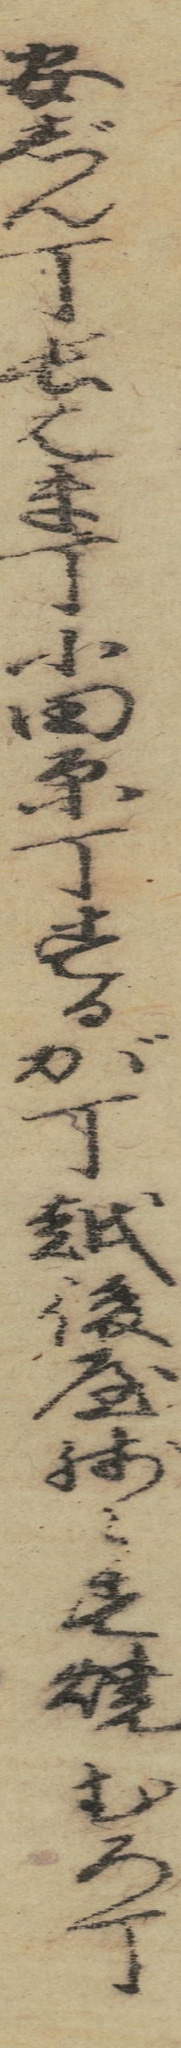安じん丁長はま丁小田原丁するが丁越後屋残らす焼むろ丁
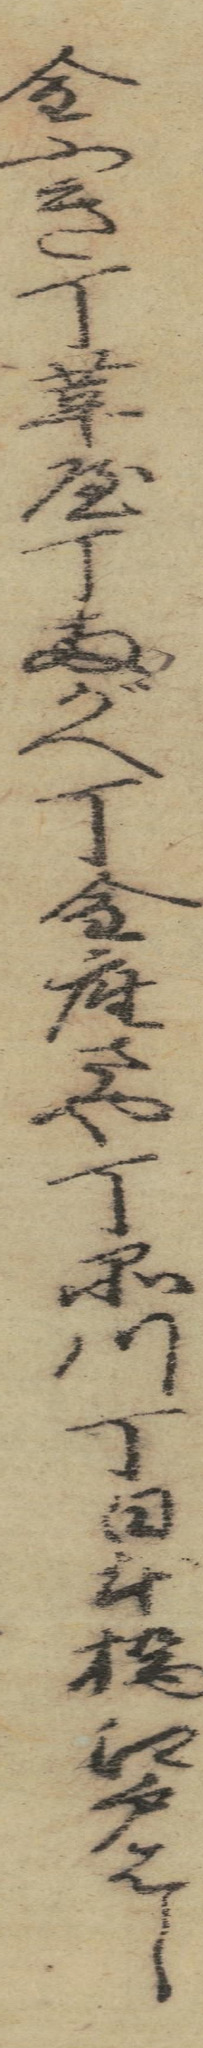金ふき丁葦屋丁兩がへ丁金座さや丁品川丁日本橋江戸はし
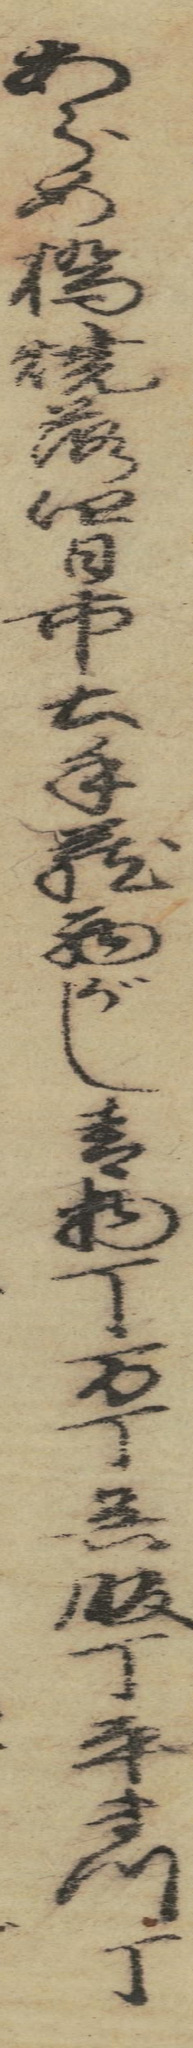あらめ橋焼落四日市土手蔵西がし青物丁万町呉服丁平まつ丁
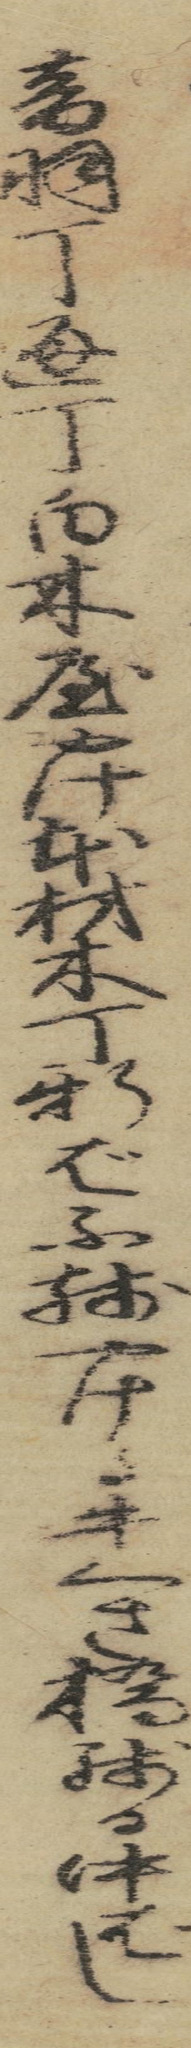音羽丁通丁白木屋やけ本材木丁新ば不残やける牛くさ橋残る中ばし
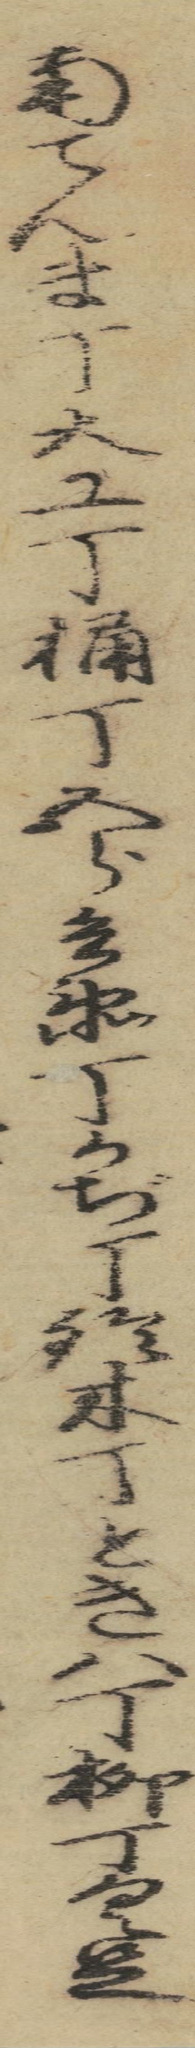南てんま丁大工丁桶丁五郎兵衛丁かぢ丁鈴木丁ときは丁柳丁具足
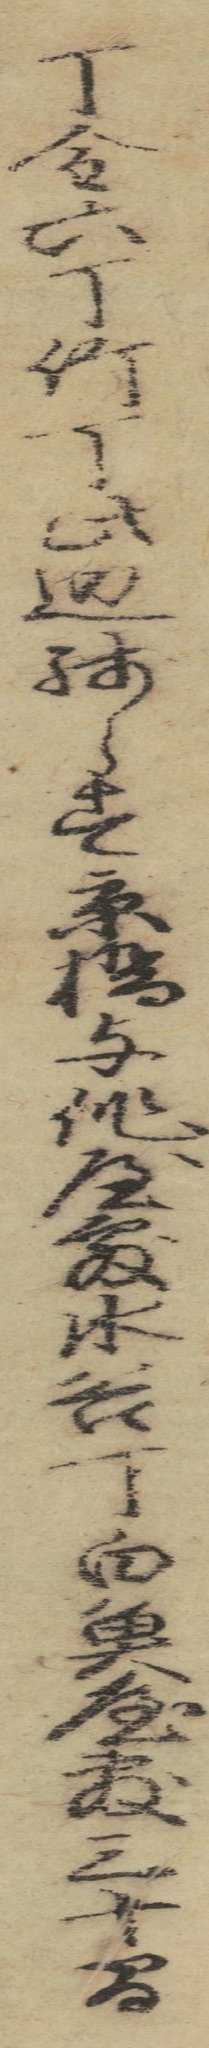丁金六丁竹丁此辺残らす京橋与作屋敷水谷丁白魚屋敷三十間
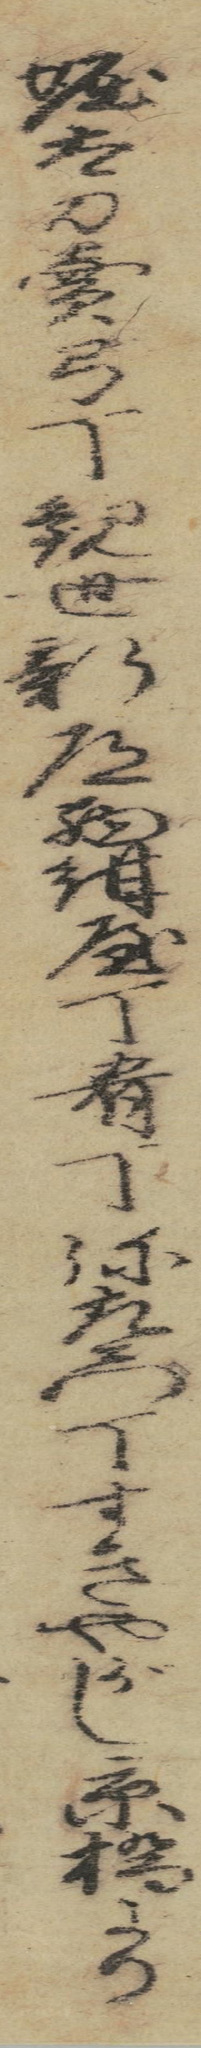堀太刀売弓丁観世新道西紺屋丁肴丁弥左衛門丁すきやがし京橋より
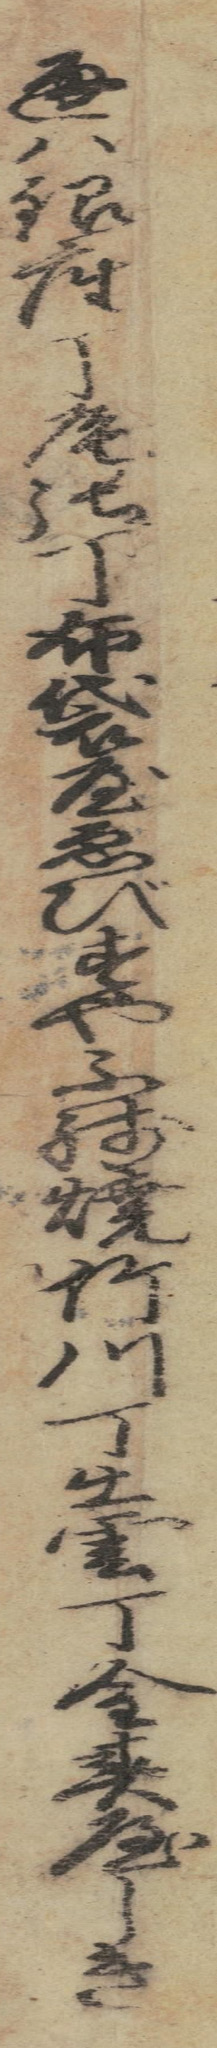通は銀座丁尾張丁布袋屋ゑびすや不残焼竹川丁出雲丁金莢屋しき
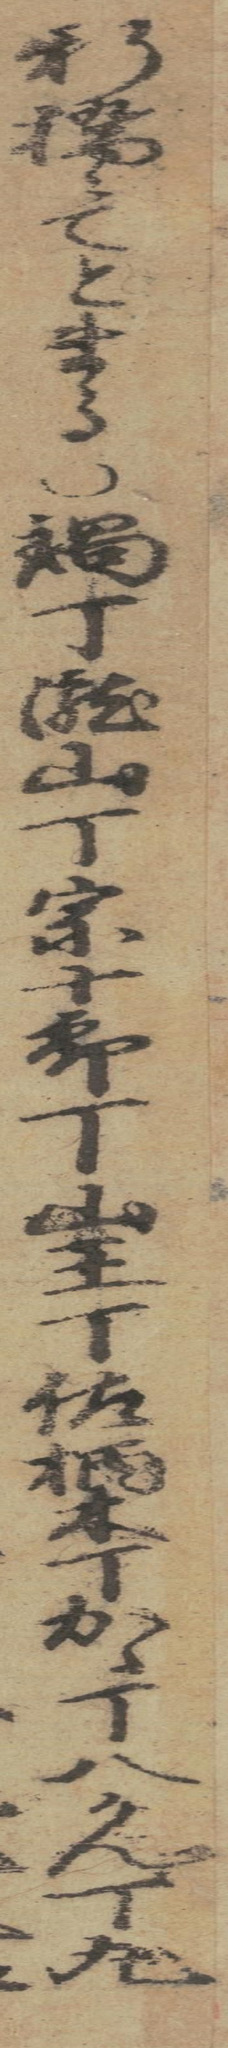新橋にてとまる◯鍋丁瀧山丁宗十郎丁山王丁佐伯丁かゝ丁八けん丁丸
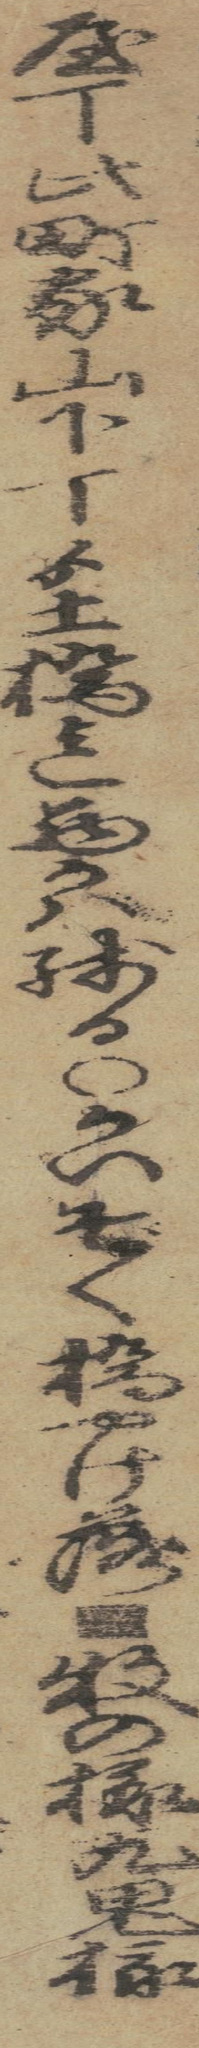屋丁此町家山下丁ゟ土橋迄西かは残る◯かいぞく橋やけ落牧の様九鬼様
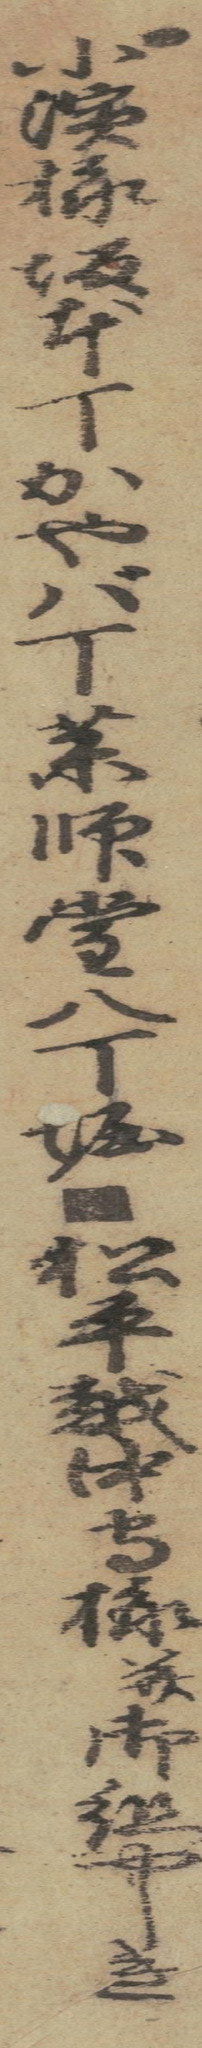●小浜様坂本丁かやば丁薬師堂八丁堀松平越中守様并御組やしき
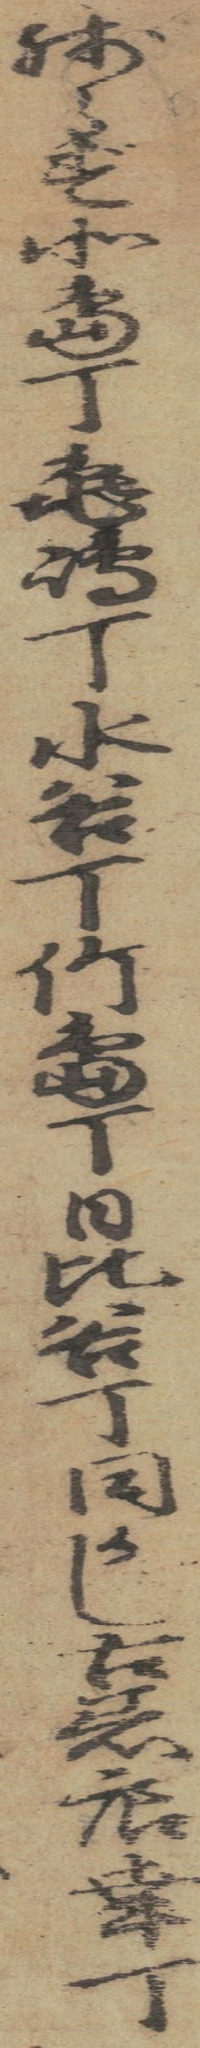残らず北嶋丁亀嶋丁水谷丁竹嶋丁日比谷丁同かし古着店幸丁
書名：方角場所附
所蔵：東京大学地震研究所図書室 Earthquake Research Institute Library, The University of Tokyo, JAPAN
